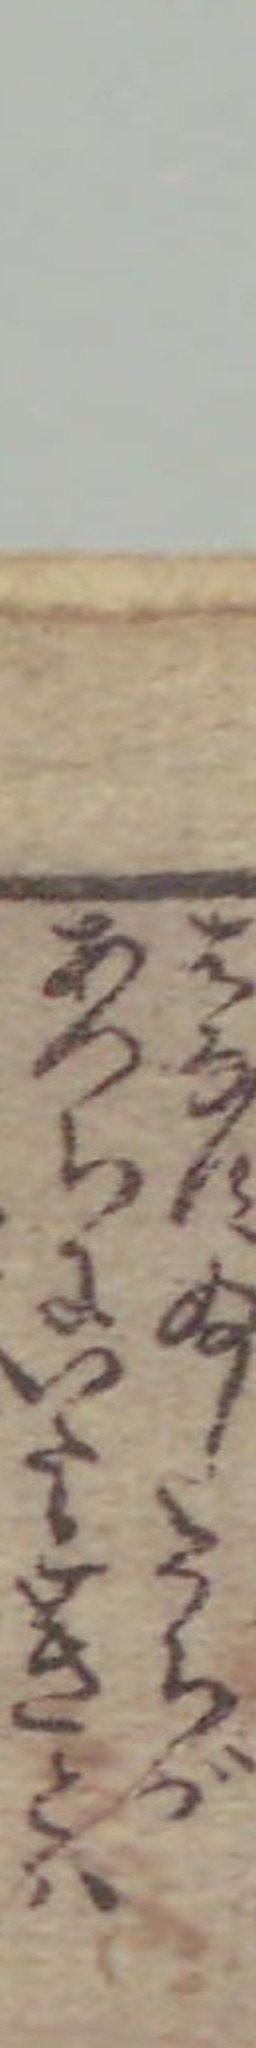あつちにいたときとは
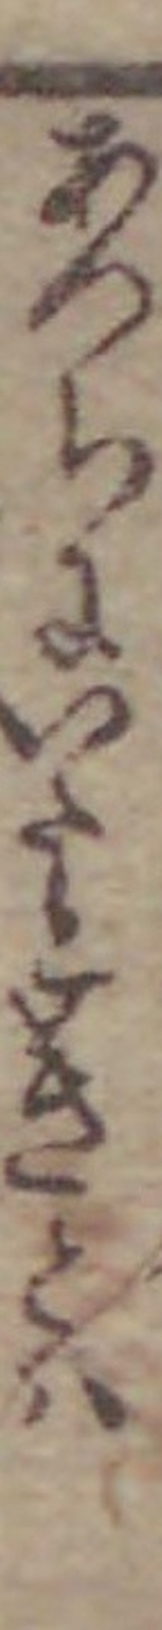あつちにいたときとは
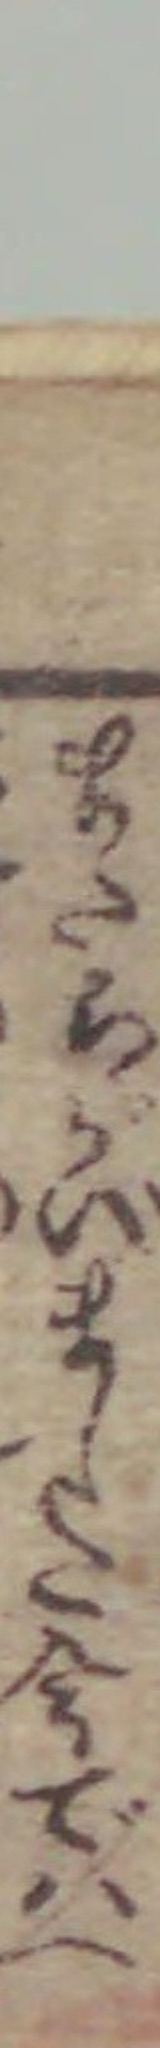またちがいました今では
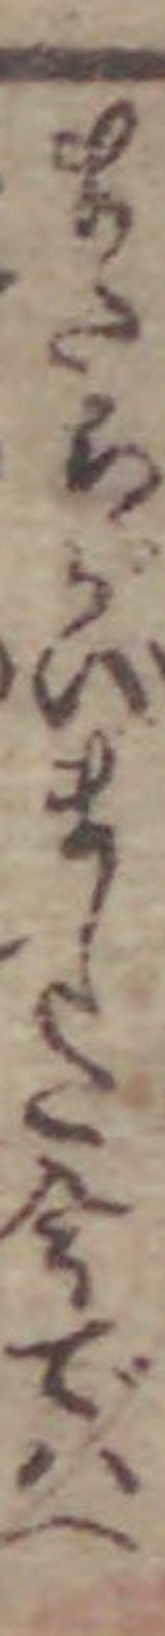またちがいました今では
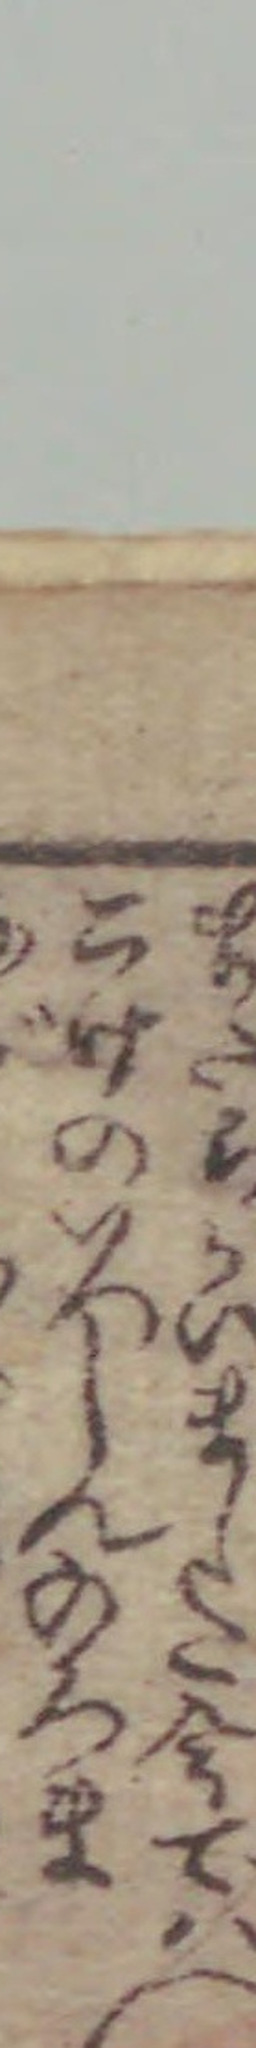こけのいつしんのろま
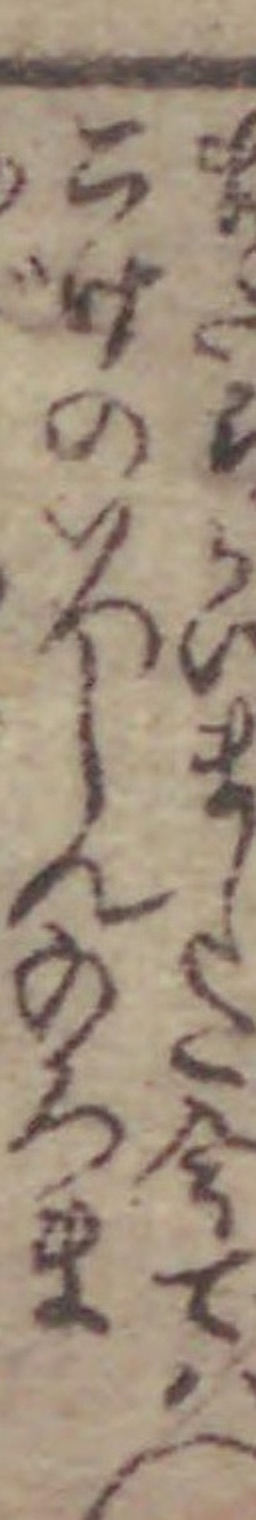こけのいつしんのろま
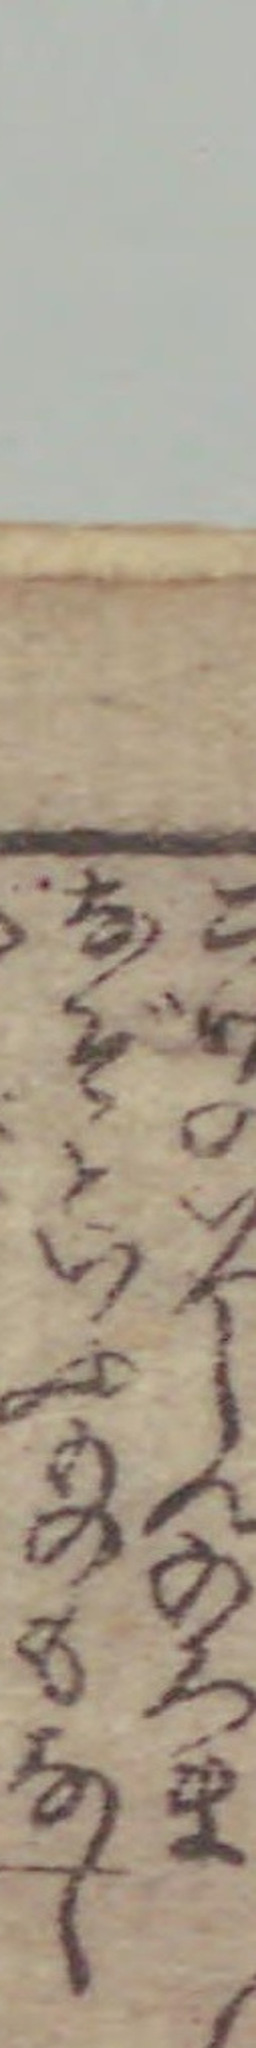なぞといふものもなし
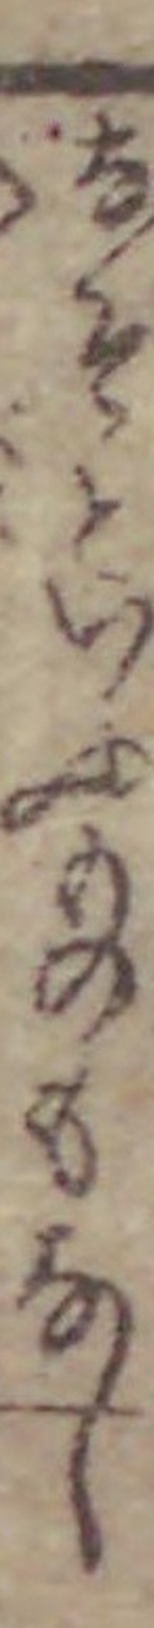なぞといふものもなし
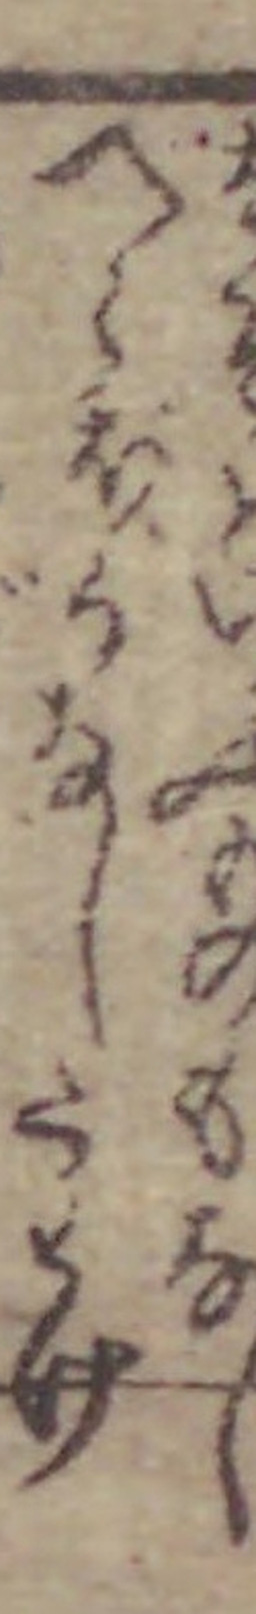べらぼうなしたわけ
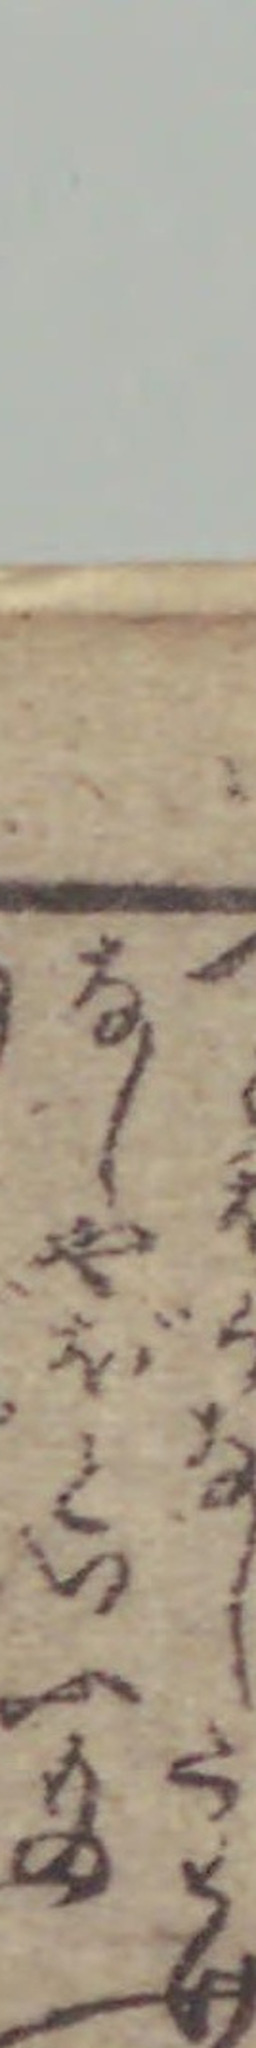なしやぼといふもの
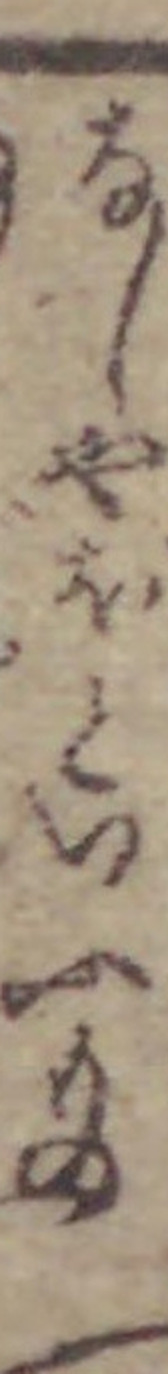なしやぼといふもの
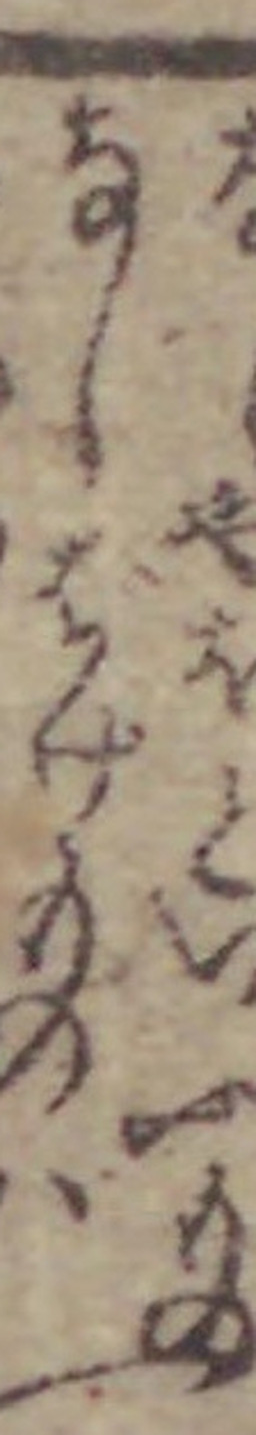なしはけものは
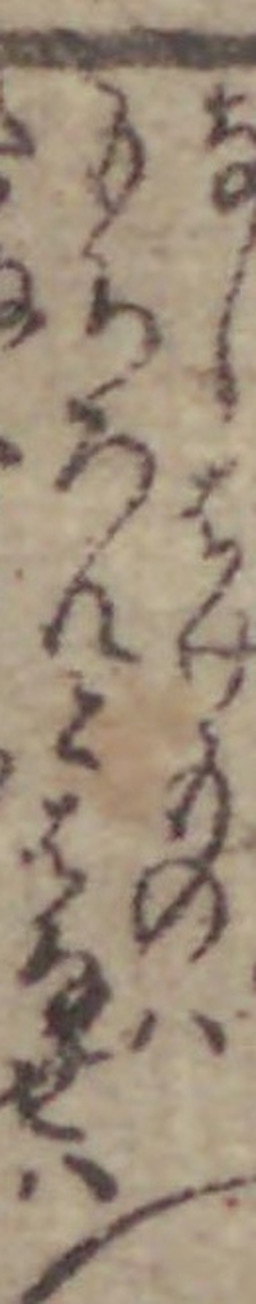もちろんとはなせは
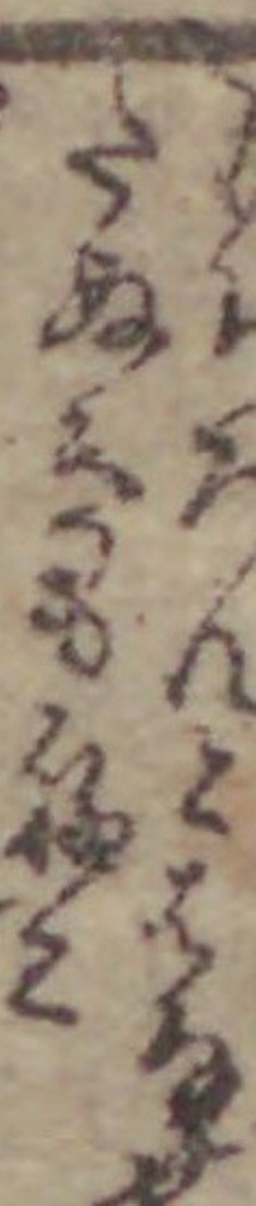たぬきもねこ
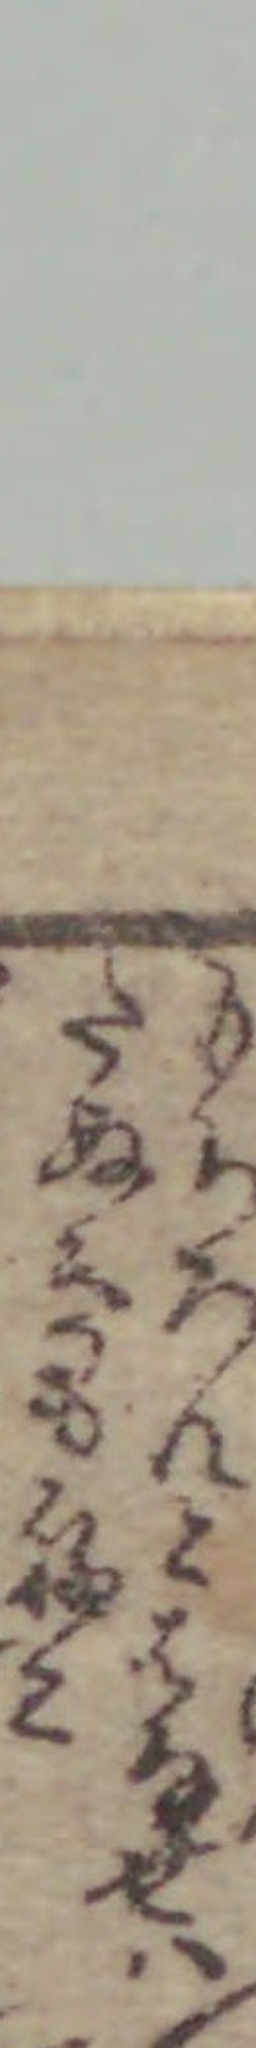たぬきもねこ
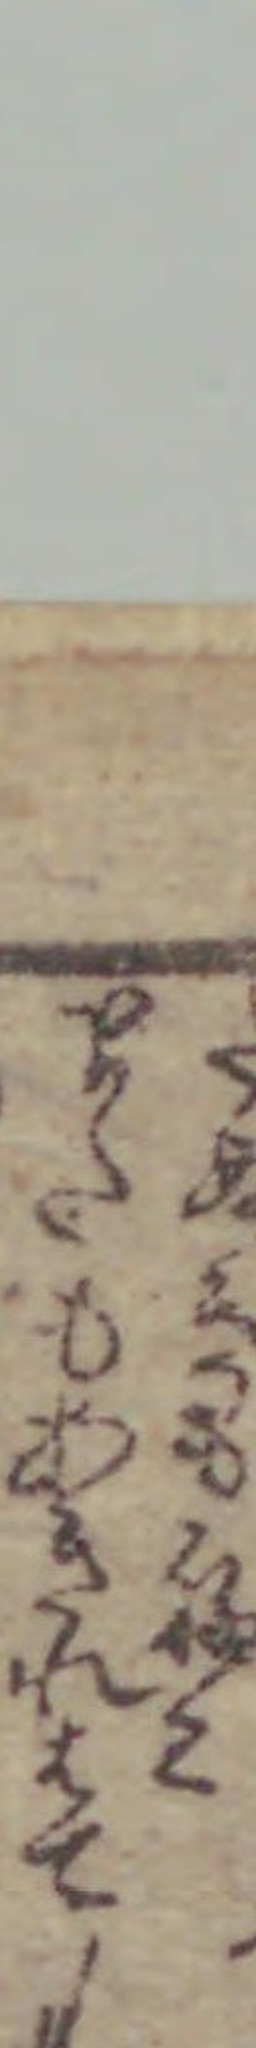またもあきれはて
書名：化物鼻がひしげ 2巻
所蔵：国立国会図書館 National Diet Library, JAPAN
